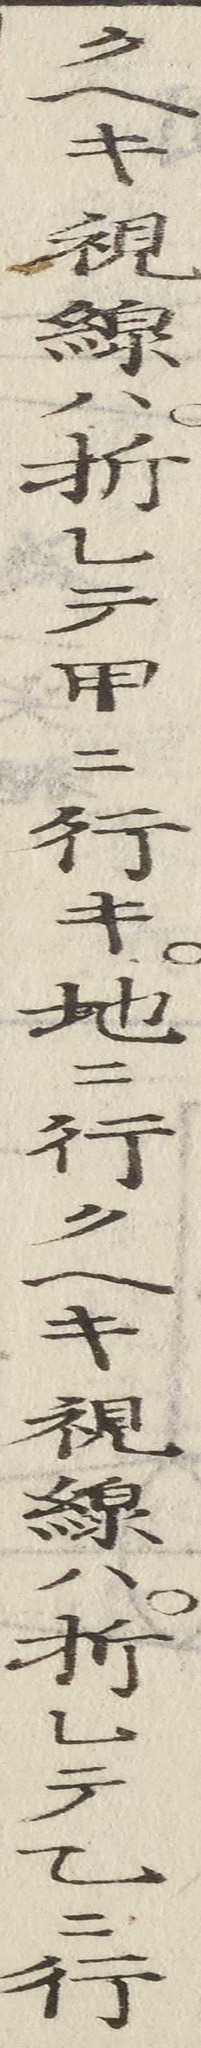クヘキ視線ハ。折レテ甲ニ行キ。地ニ行クヘキ視線ハ。折レテ乙ニ行
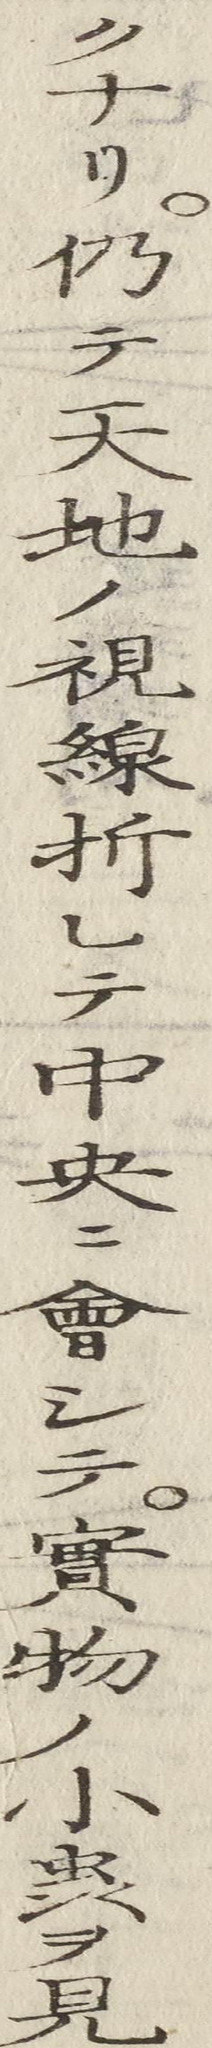クナリ。仍テ天地ノ視線折レテ中央ニ会シテ。実物ノ小蟲ヲ見
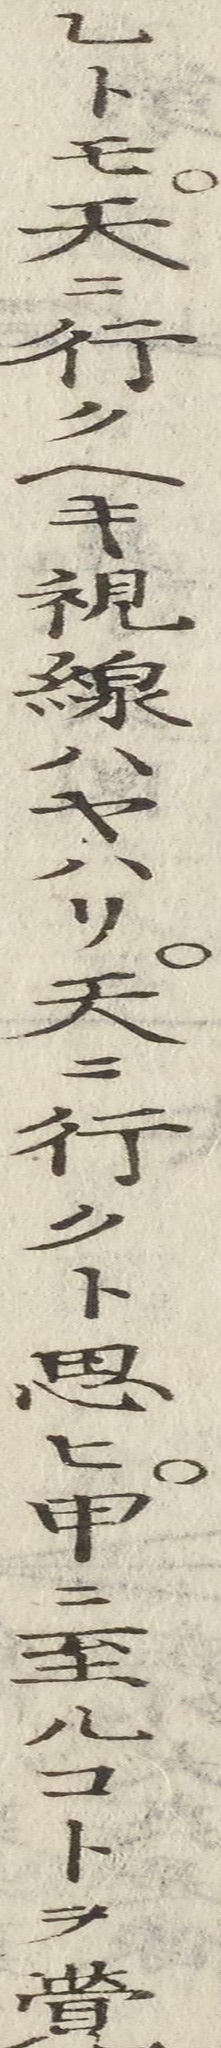レトモ。天ニ行クヘキ視線ハヤハリ。天ニ行クト思ヒ。甲ニ至ルコトヲ覚
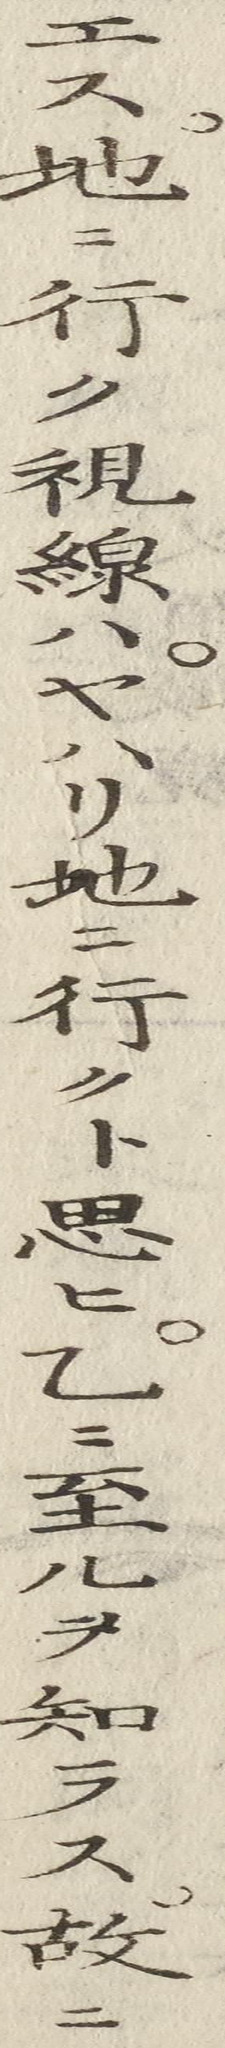エス。地ニ行ク視線ハ。ヤハリ地ニ行クト思ヒ。乙ニ至ルヲ知ラス。故ニ
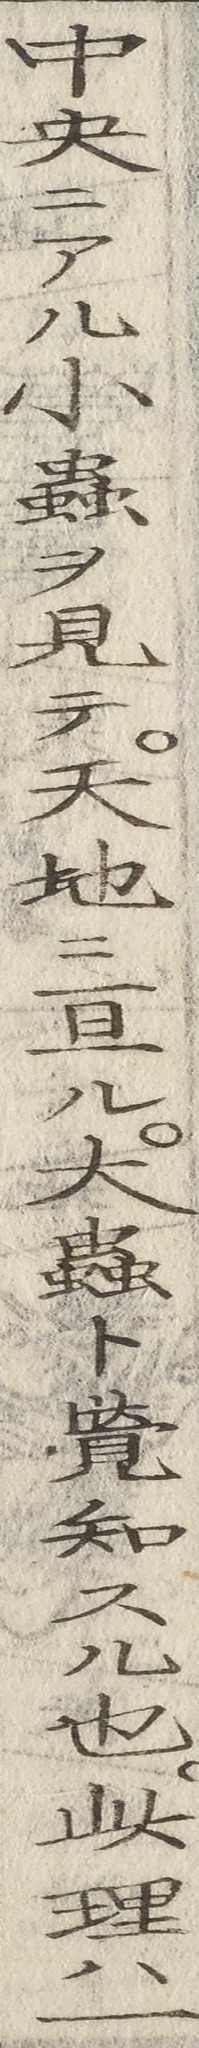中央ニアル小蟲ヲ見テ。天地ニ亘ル。大蟲ト覚知スル也。此理ハ一
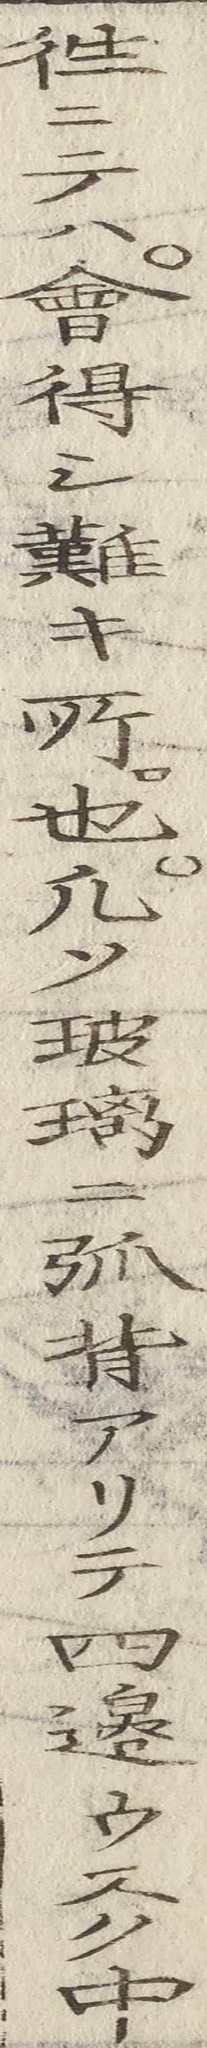往ニテハ。会得シ難キ所也。凡ソ玻璃ニ弧背アリテ四辺ウスク中
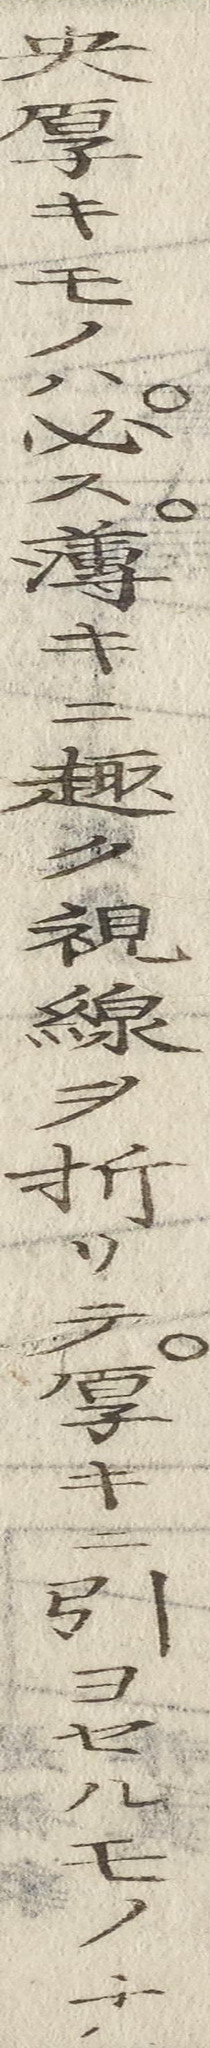央厚キモノハ。必ス。薄キニ趣ク視線ヲ折リテ。厚キニ引ヨセルモノナ
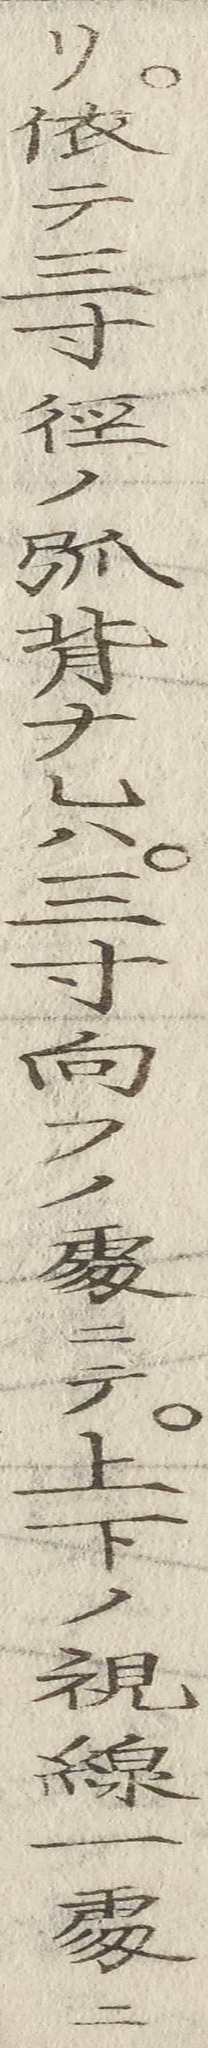リ。依テ三寸径ノ弧背ナレハ。三寸向フノ処ニテ。上下ノ視線一処ニ
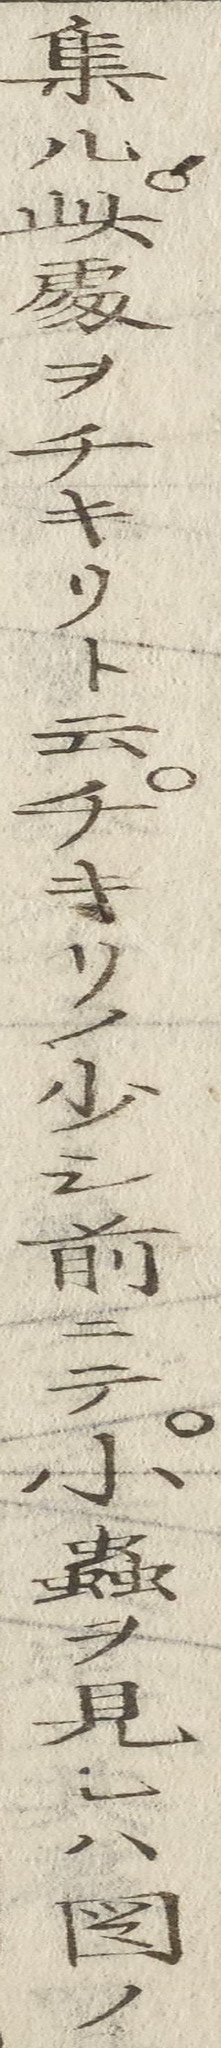集ル。此処ヲチキリト云。チキリノ少シ前ニテ。小蟲ヲ見レハ図ノ
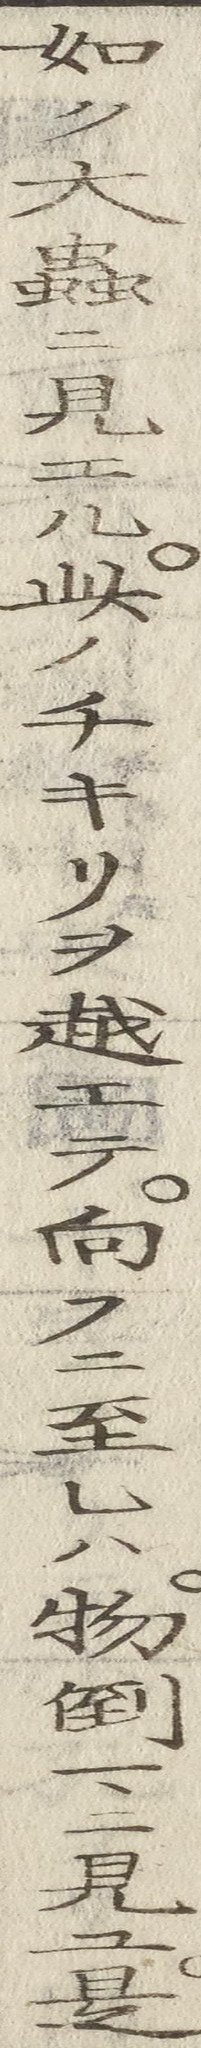如ク大蟲ニ見エル。此ノチキリヲ越エテ。向フニ至レハ。物倒マニ見ユ。是
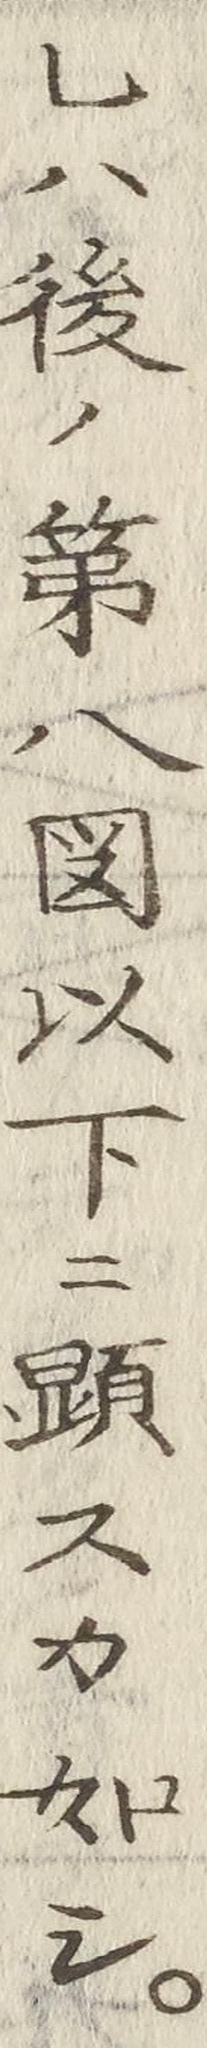レハ後ノ第八図以下ニ顕スカ如シ。
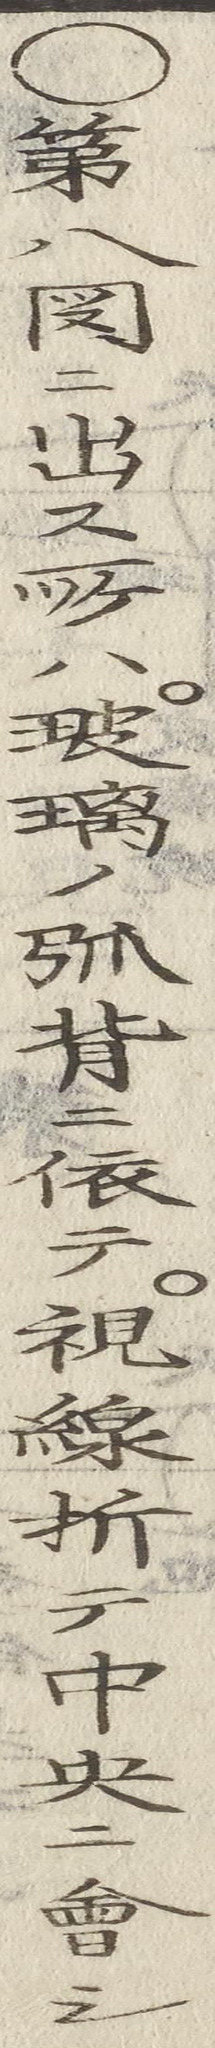○第八図ニ出ス所ハ。玻璃ノ弧背ニ依テ。視線折テ中央ニ会シ
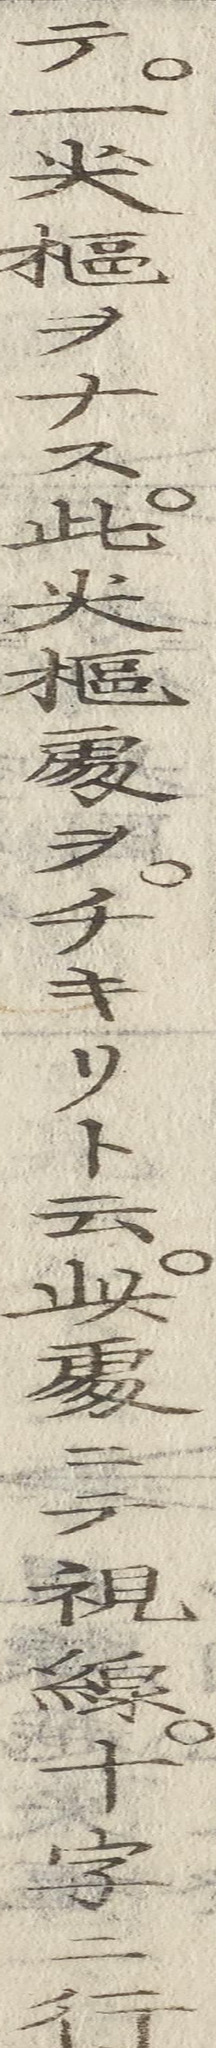テ。一尖枢ヲナス。此尖枢処ヲ。チキリト云。此処ニテ視線。十字ニ行
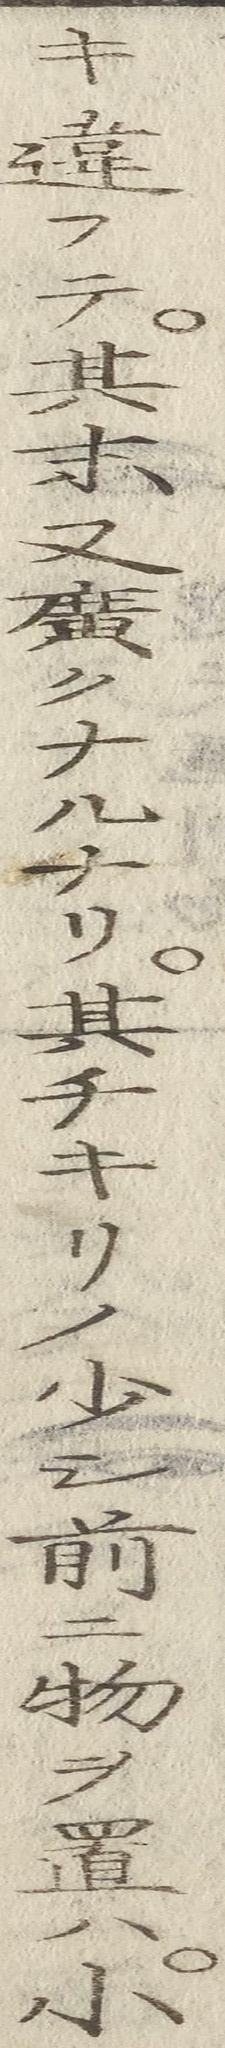キ違フテ。其末又広クナルナリ。其チキリノ少シ前ニ物ヲ置ハ。小

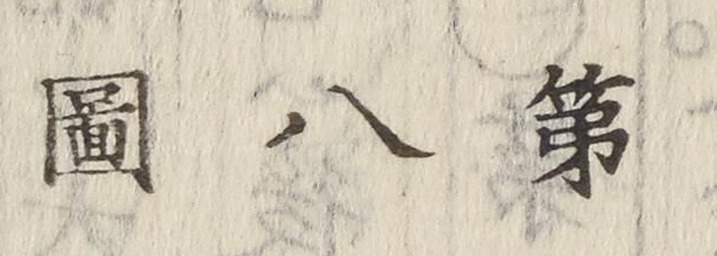第八図
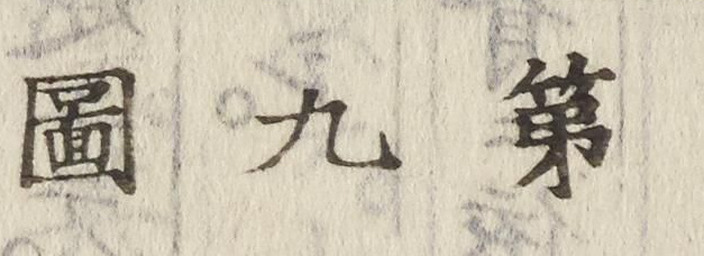第九図
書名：護法新論　上
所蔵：東京大学地震研究所図書室 Earthquake Research Institute Library, The University of Tokyo, JAPAN
